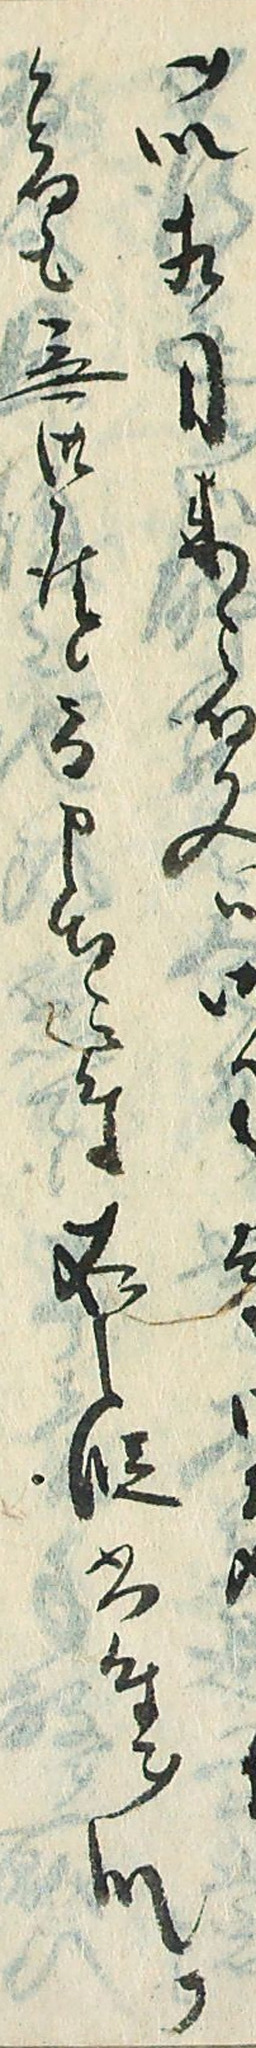候者も無御座候旨申出候に付右之段書付を以て
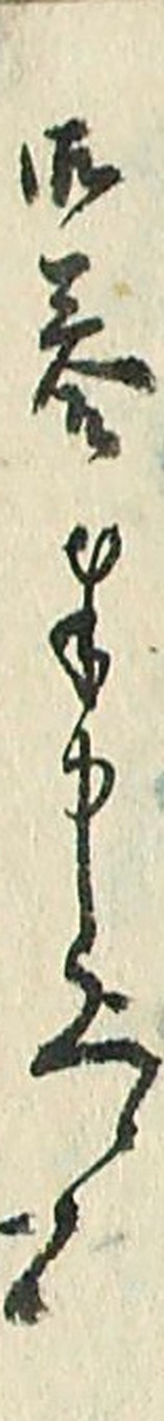御答奉申上候以上

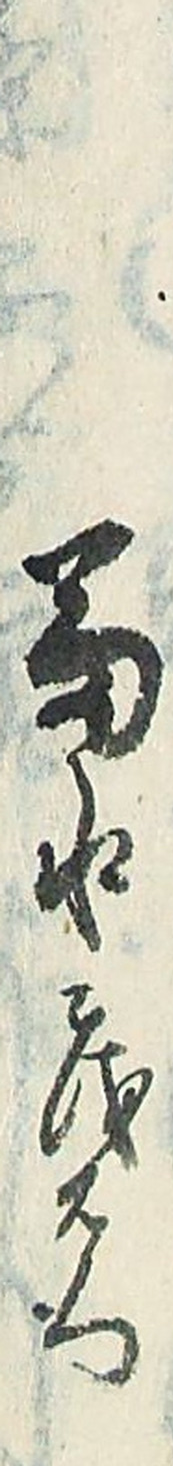冨永茂右衛門
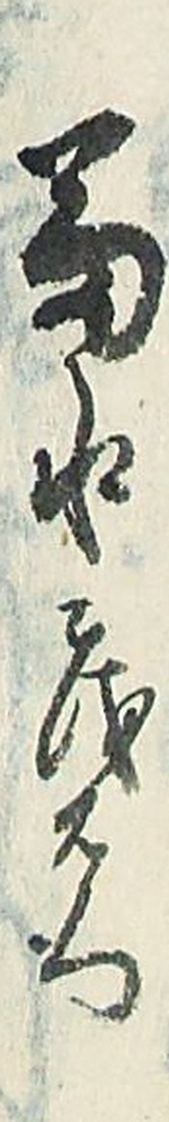冨永茂右衛門
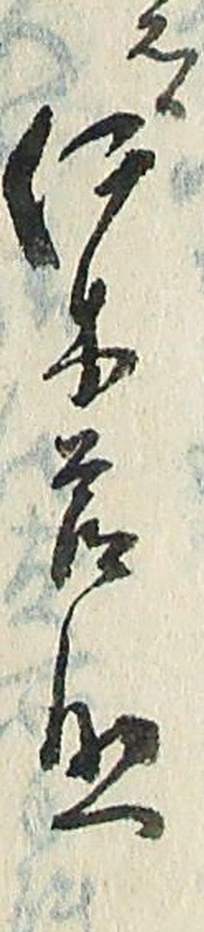仁木節助
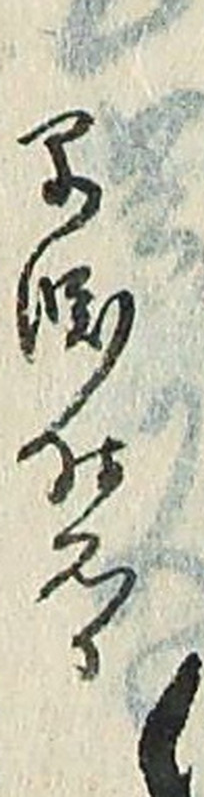早淵村右同
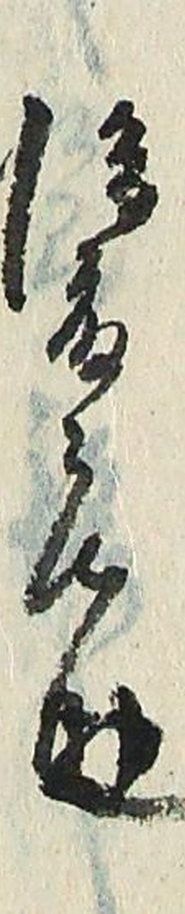後藤庄助
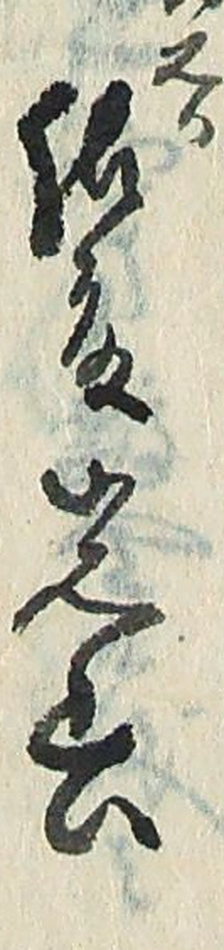佐藤岩六
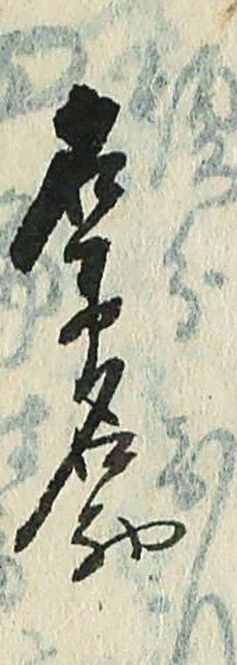名東名西
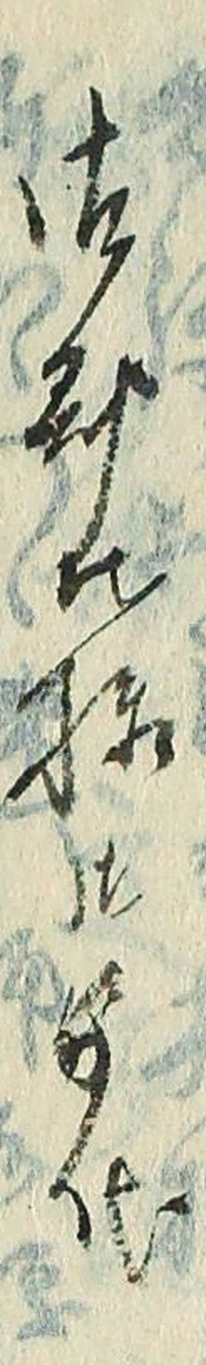御郡代様御手代
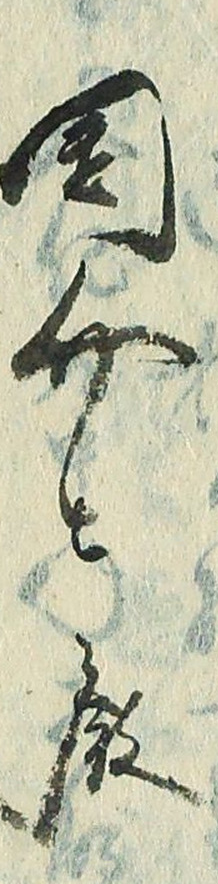岡竹七殿
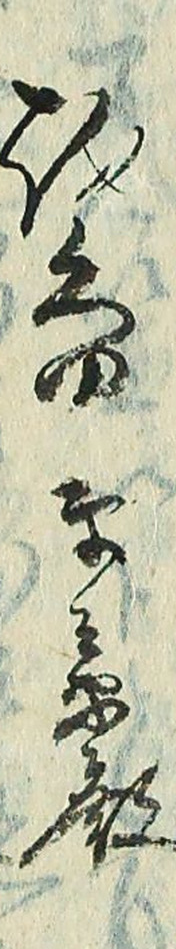越久田平兵衛殿
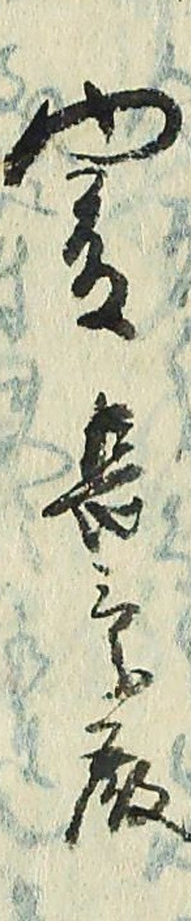内藤長三郎殿
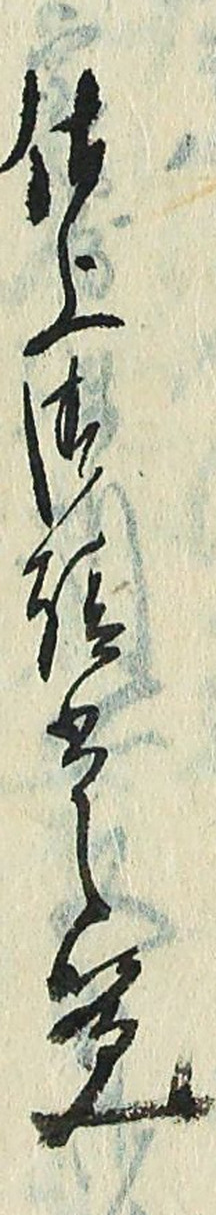仕上御請書之覚
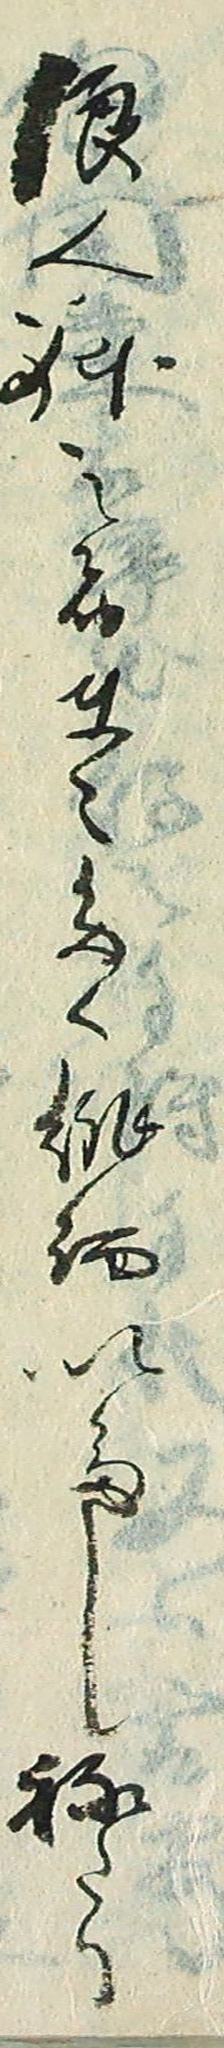浪人体之者在々多く徘徊いたしねたり
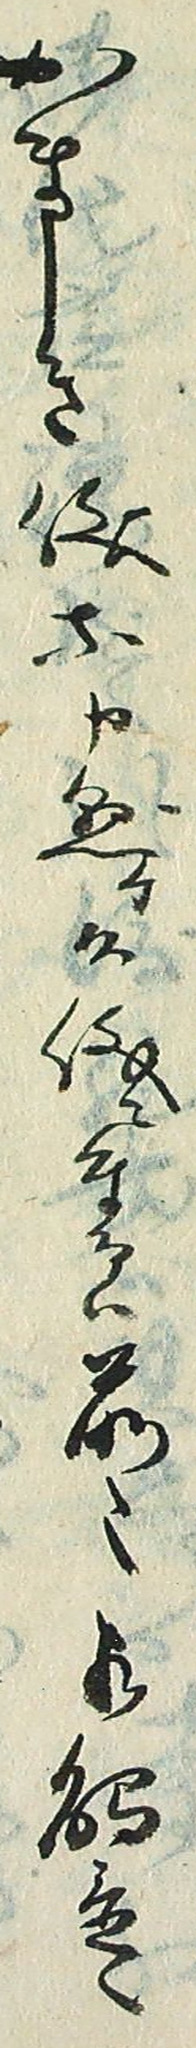かましき儀等申懸け候儀に付ては前々相触置候
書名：諸御用御□受書控
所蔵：鳴門教育大学 Naruto University of Education
